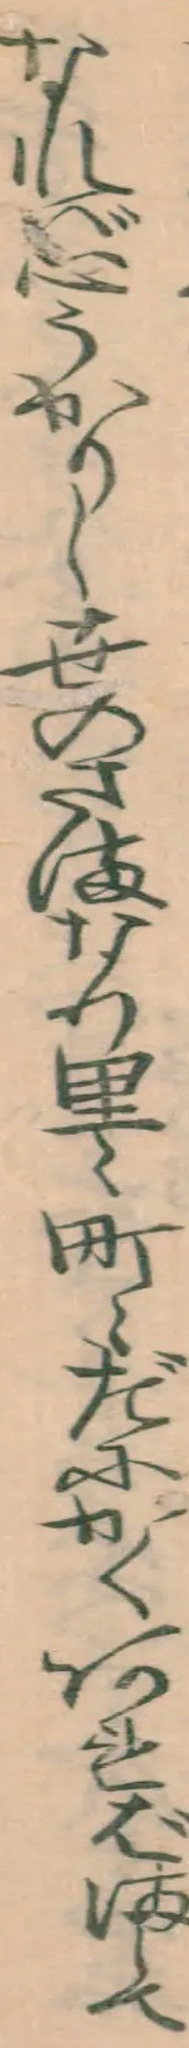なれば心うかりし世のさまなり里々町々だにかくあればまして
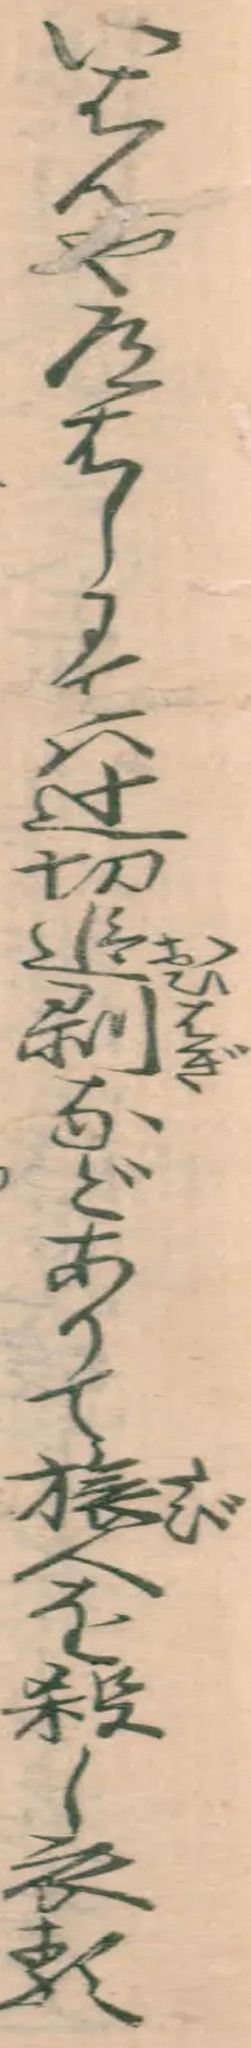いはんや道はしにては辻切追剥などありて旅人を殺し衣類
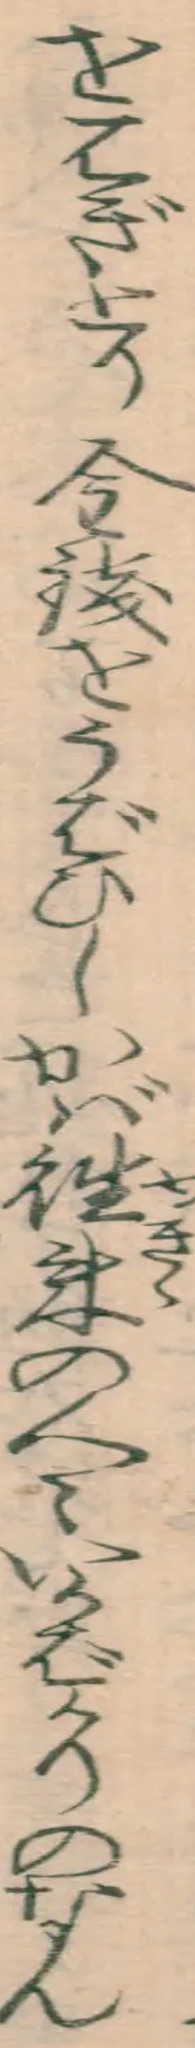をはぎとり金銭をうばひしかば往来の人々いかばかりのなん
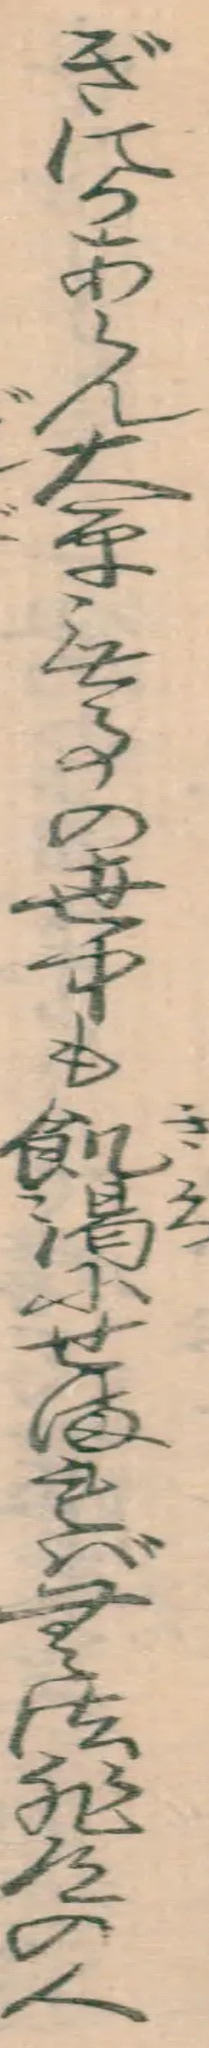ぎにかあらん大平無事の世中も飢渇にせまれば無法非道の人
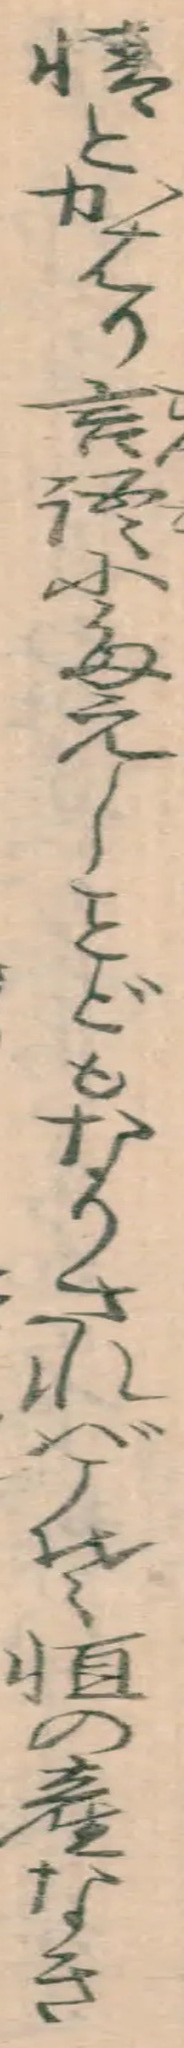情とかはり言語にたえしことどもなりさればこそ恒の産なき
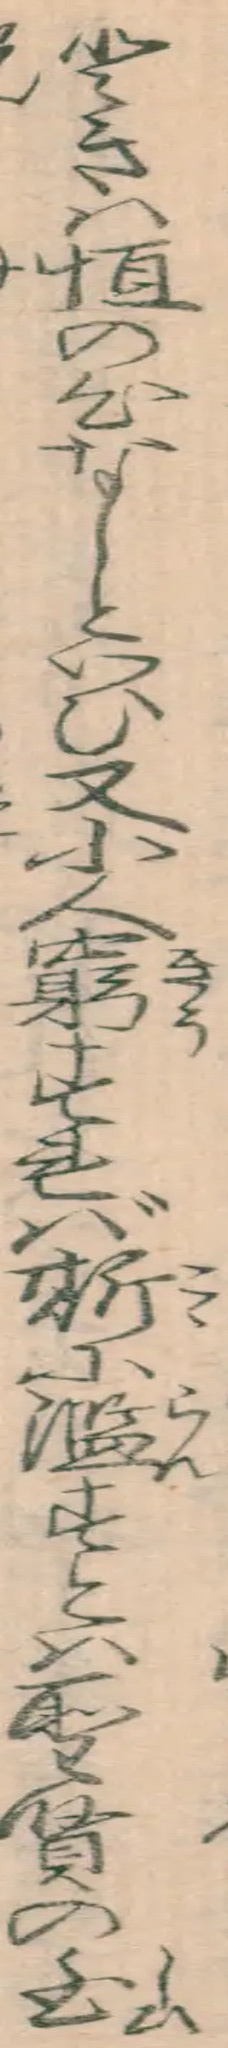ときは恒の心なしといひ又小人窮すれば斯に濫すとは聖賢の至
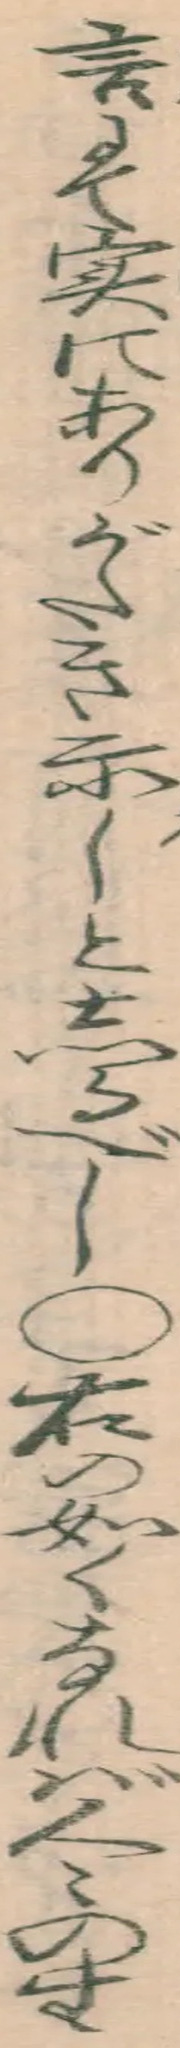言にて実にありがたき示しとしるべし○右の如くなれば人々の生
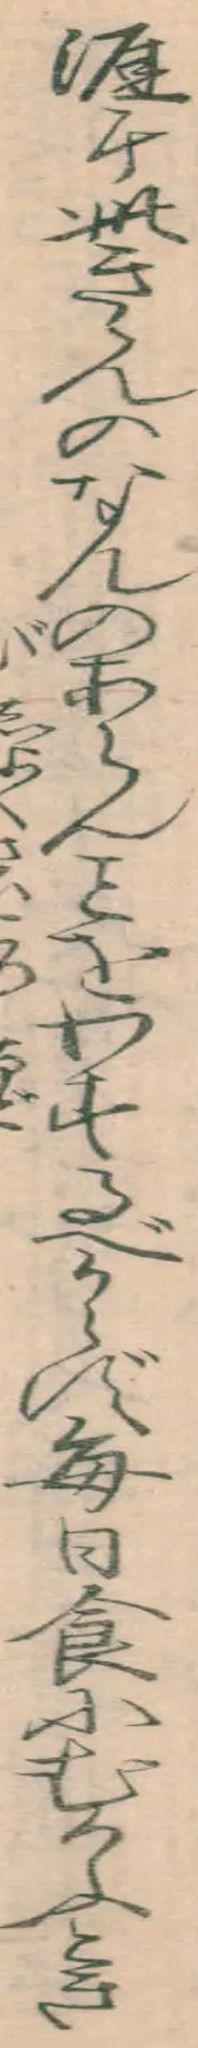涯に此きゝんのなんのあらんことをわするべからず毎日食にむかふとき
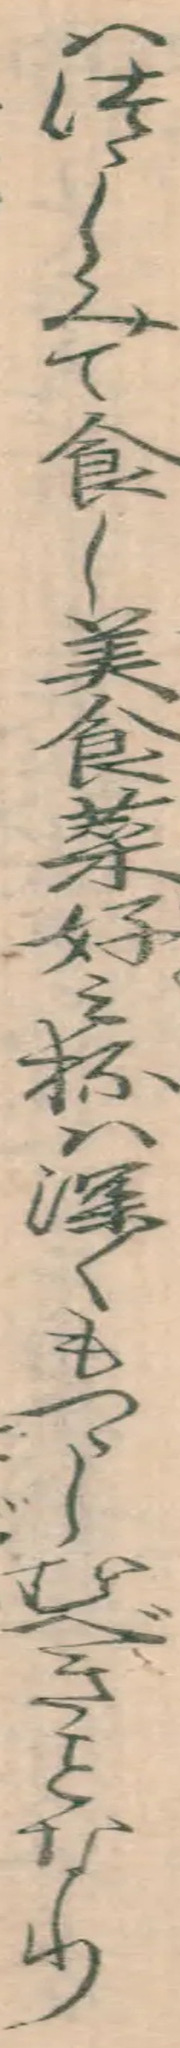はつゝしみて食し美食菜好み抔は深くもつゝしむべきことなり
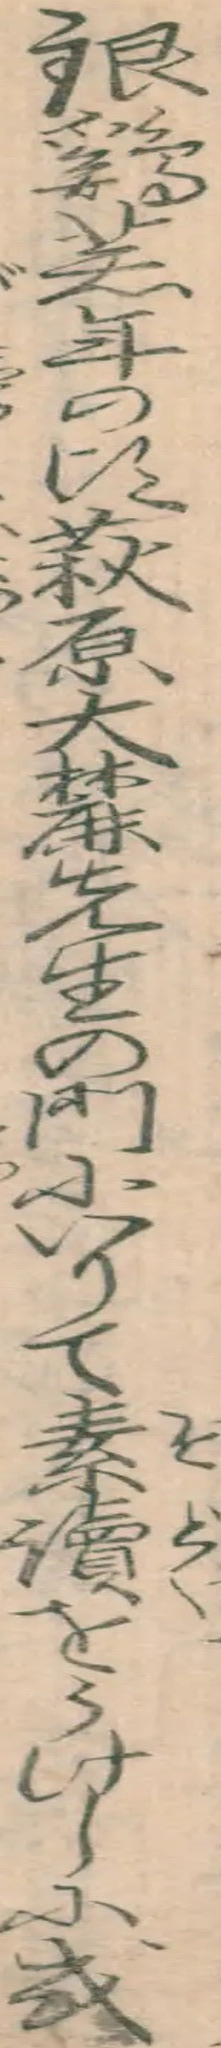銀鶏若年の頃萩原大麓先生の門にいりて素読をうけしに或
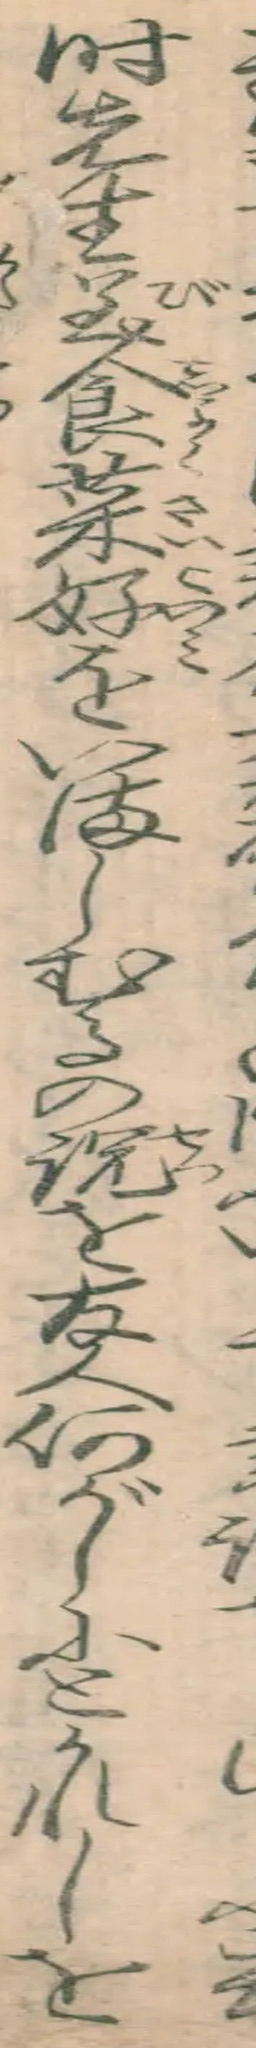時先生美食菜好をいましむるの説を友人何がしにとかれしを
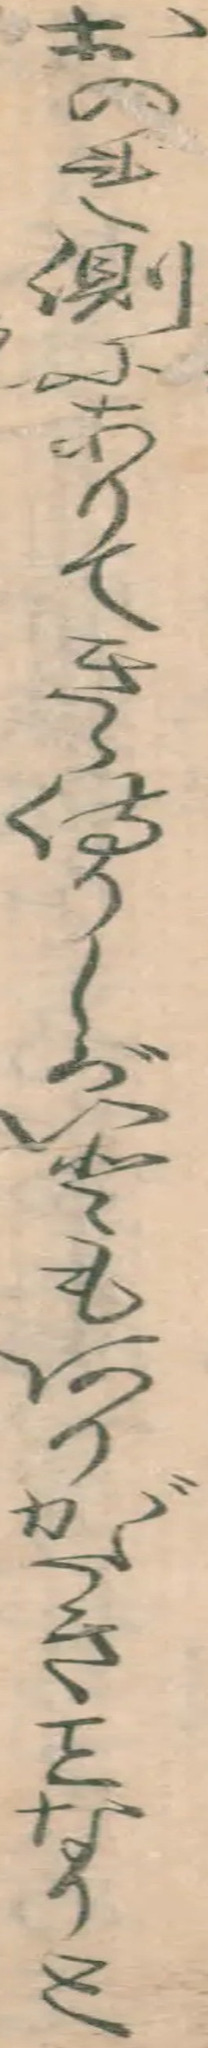おのれ側にありてきゝ侍りしがいともありがたきことなりと
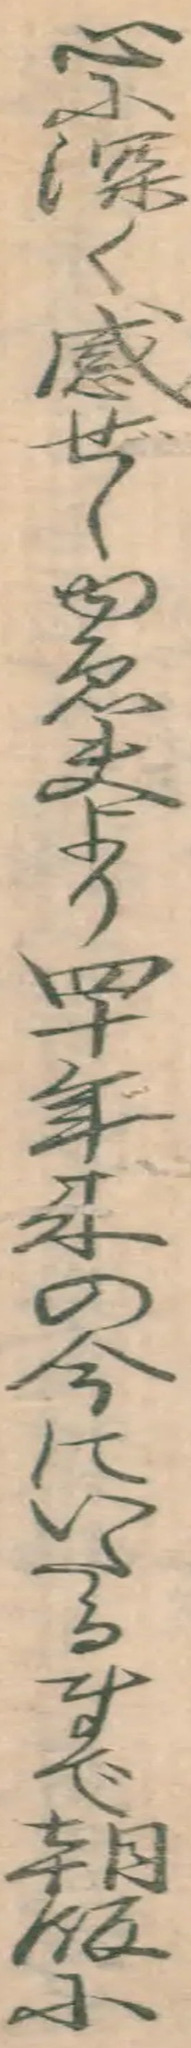心に深く感ぜしゆゑ夫より四十年来の今にいたるまで朝飯に

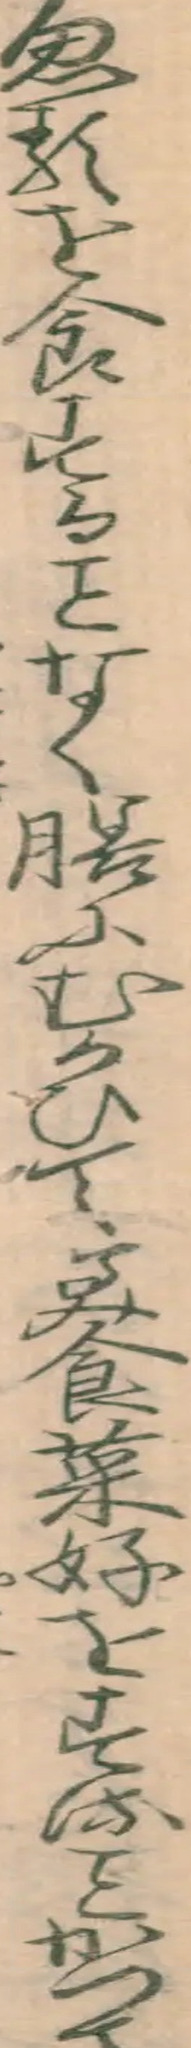魚類を食することなく膳にむかひて美食菜好をすることかつて
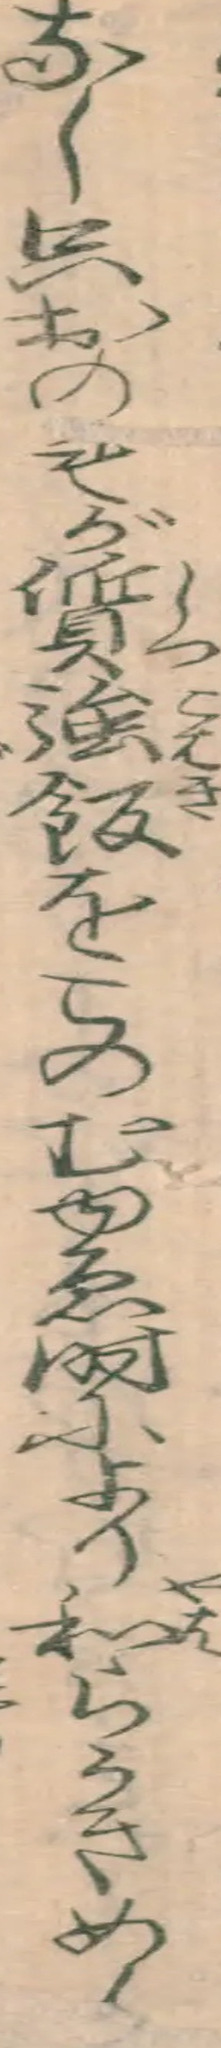なし只おのれが質強飯をこのむゆゑ時により和らかきめし
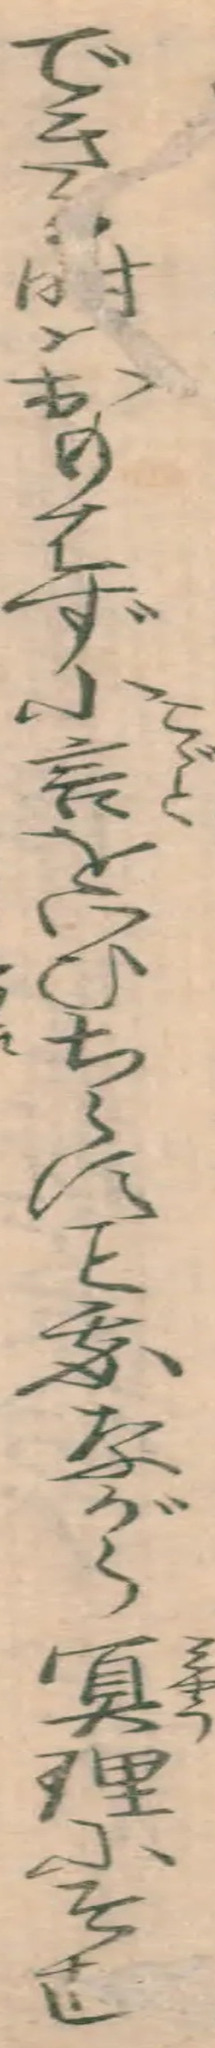できる時はおもはず小言をいひちらすこと我ながら冥理にそむ
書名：日ごとの心得
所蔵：国立国会図書館 National Diet Library, JAPAN
